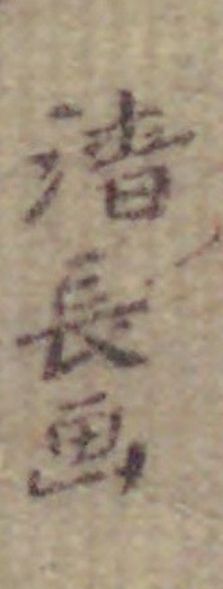清長画
